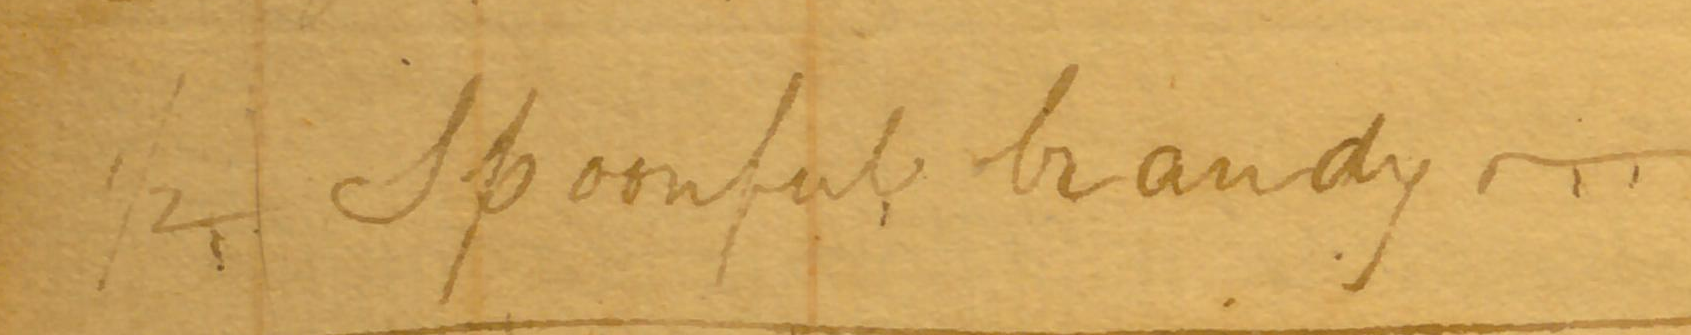1/2 spoonful brandy-
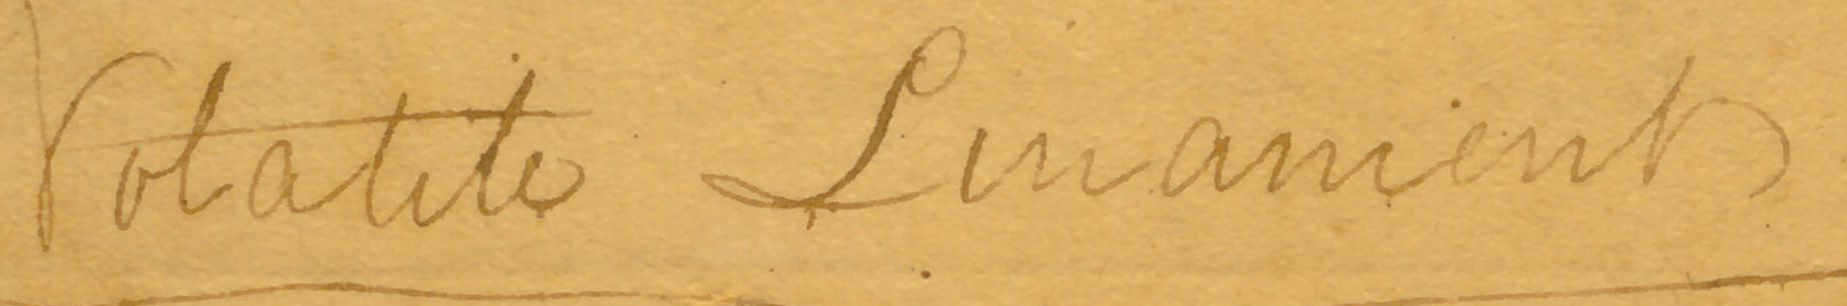Volatitle Linament
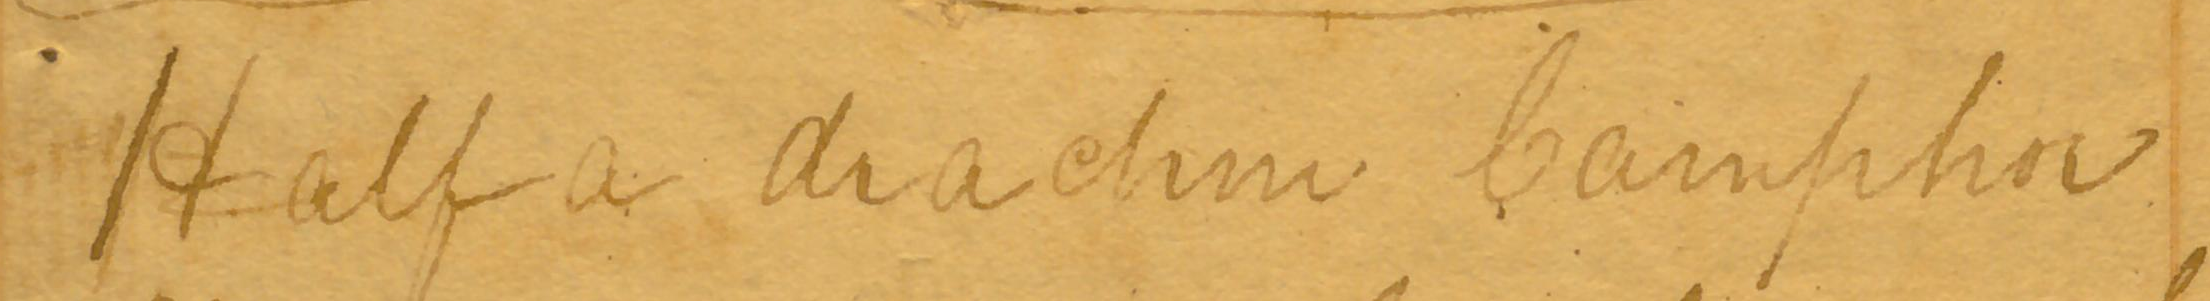Half a drachm Camphor
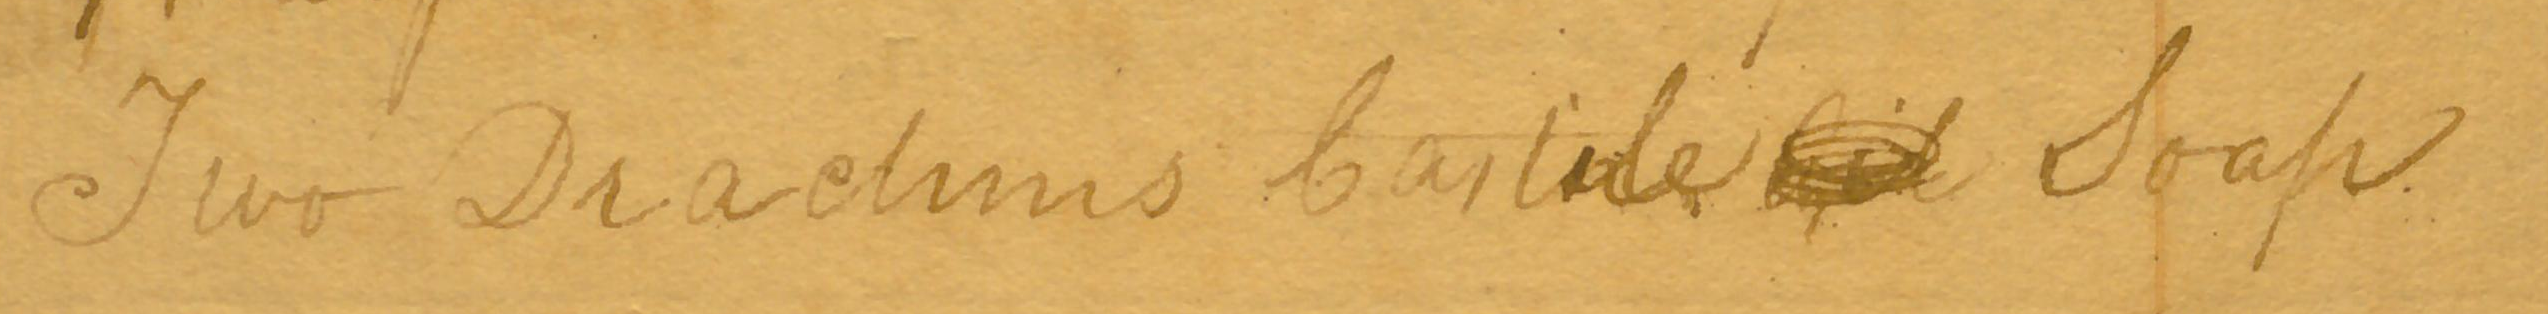Two Drachms Castile [Oil] Soap
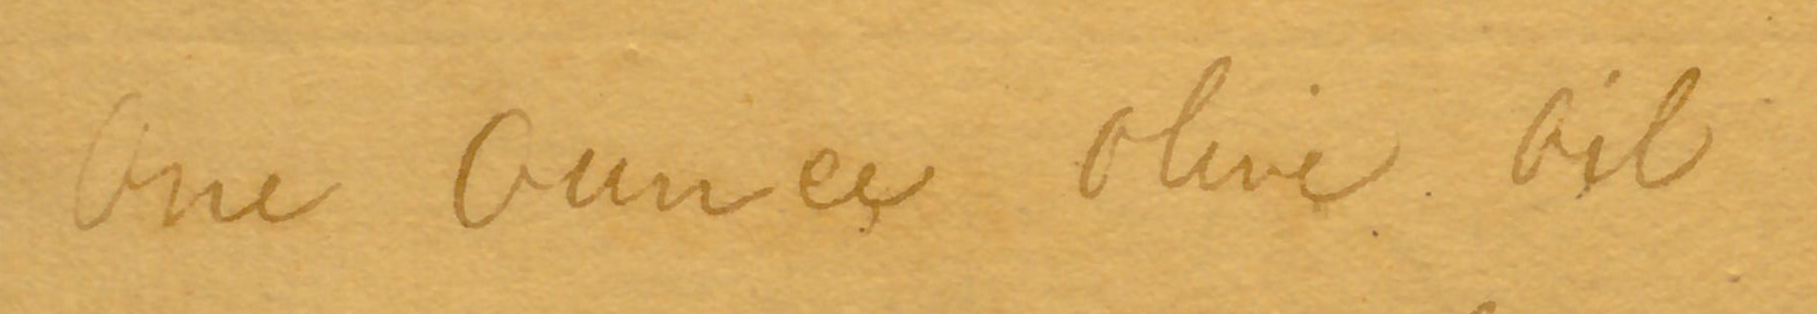One ounce olive oil
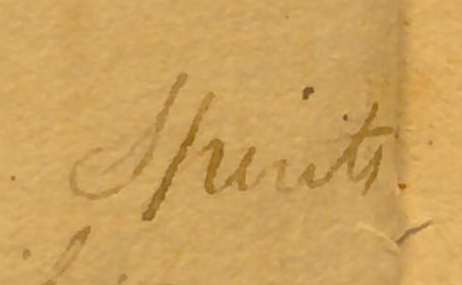Spirits
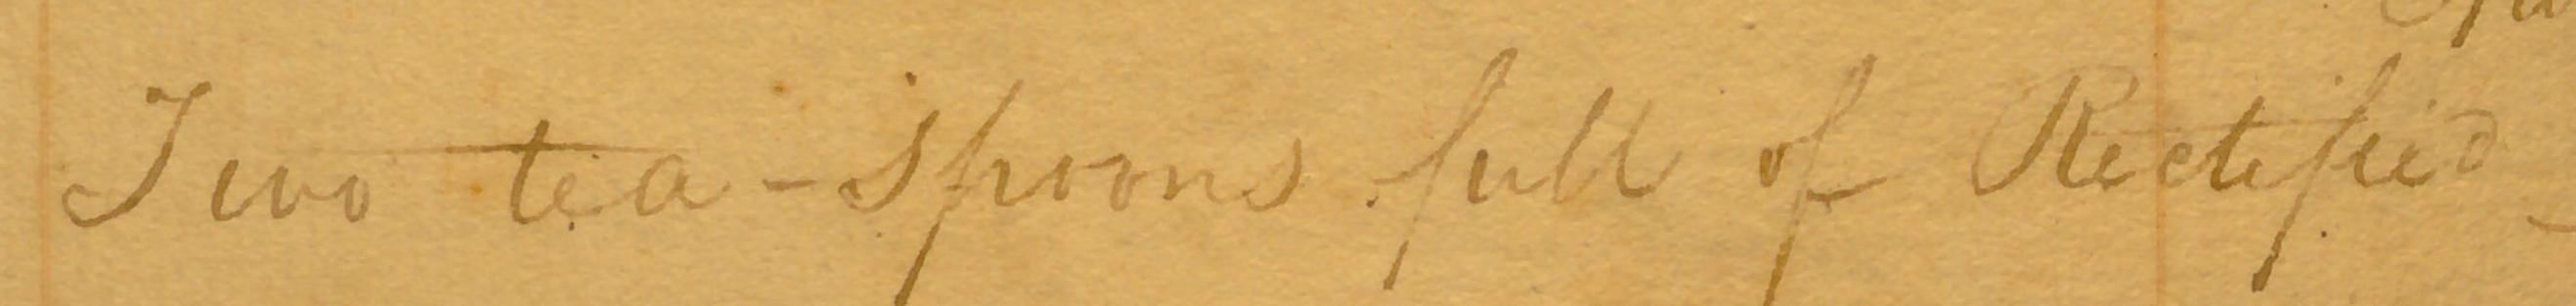Two tea-spoons full of Rectified
